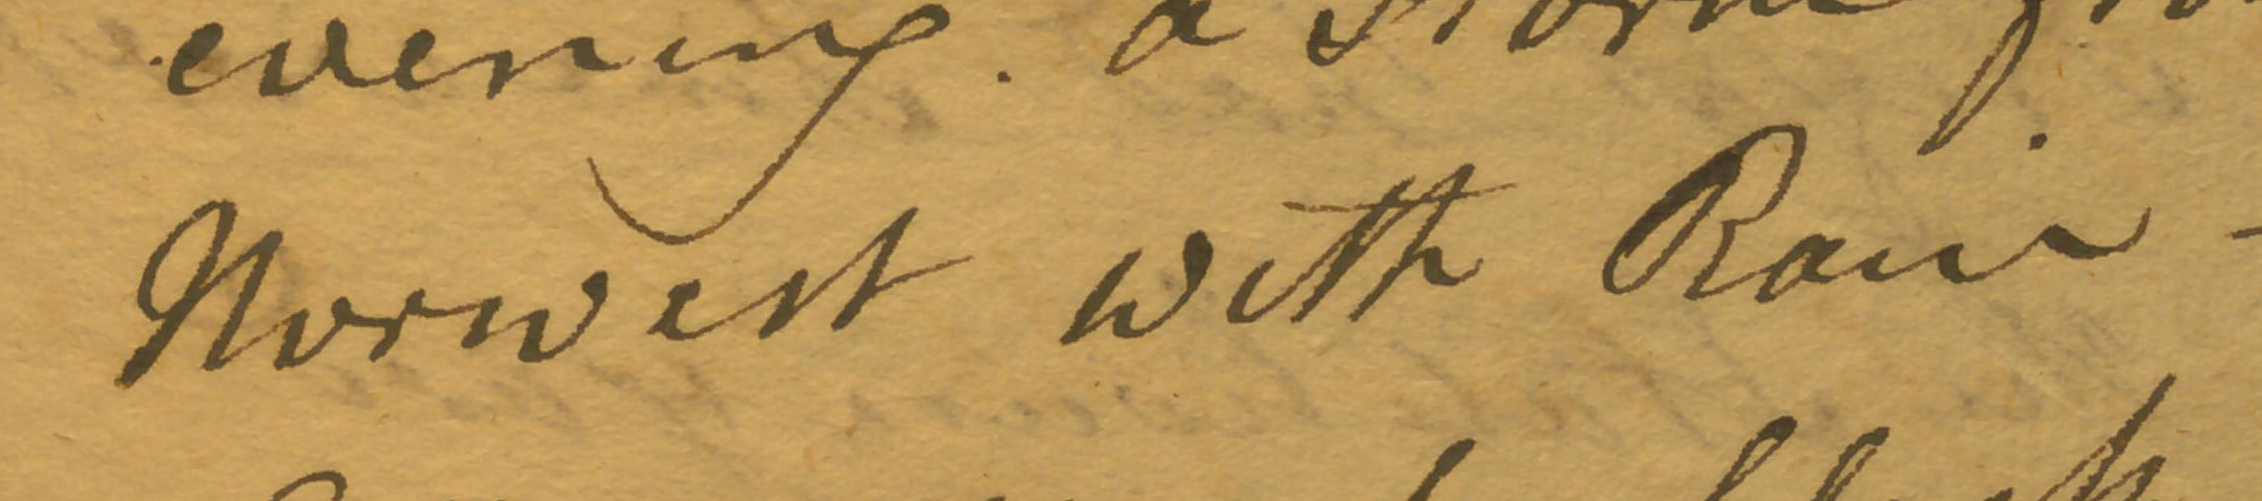Norwest with Rain
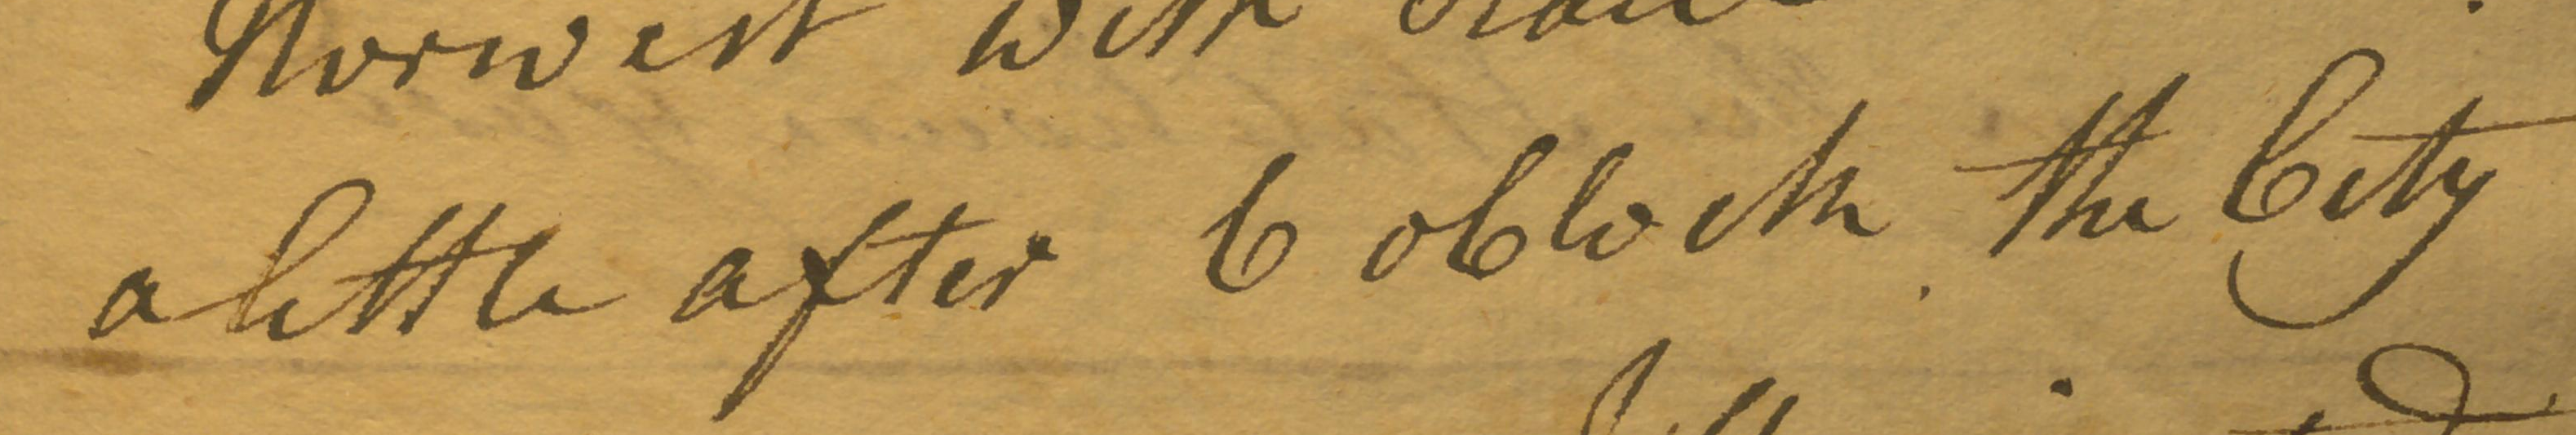a little after 6 oClock the City
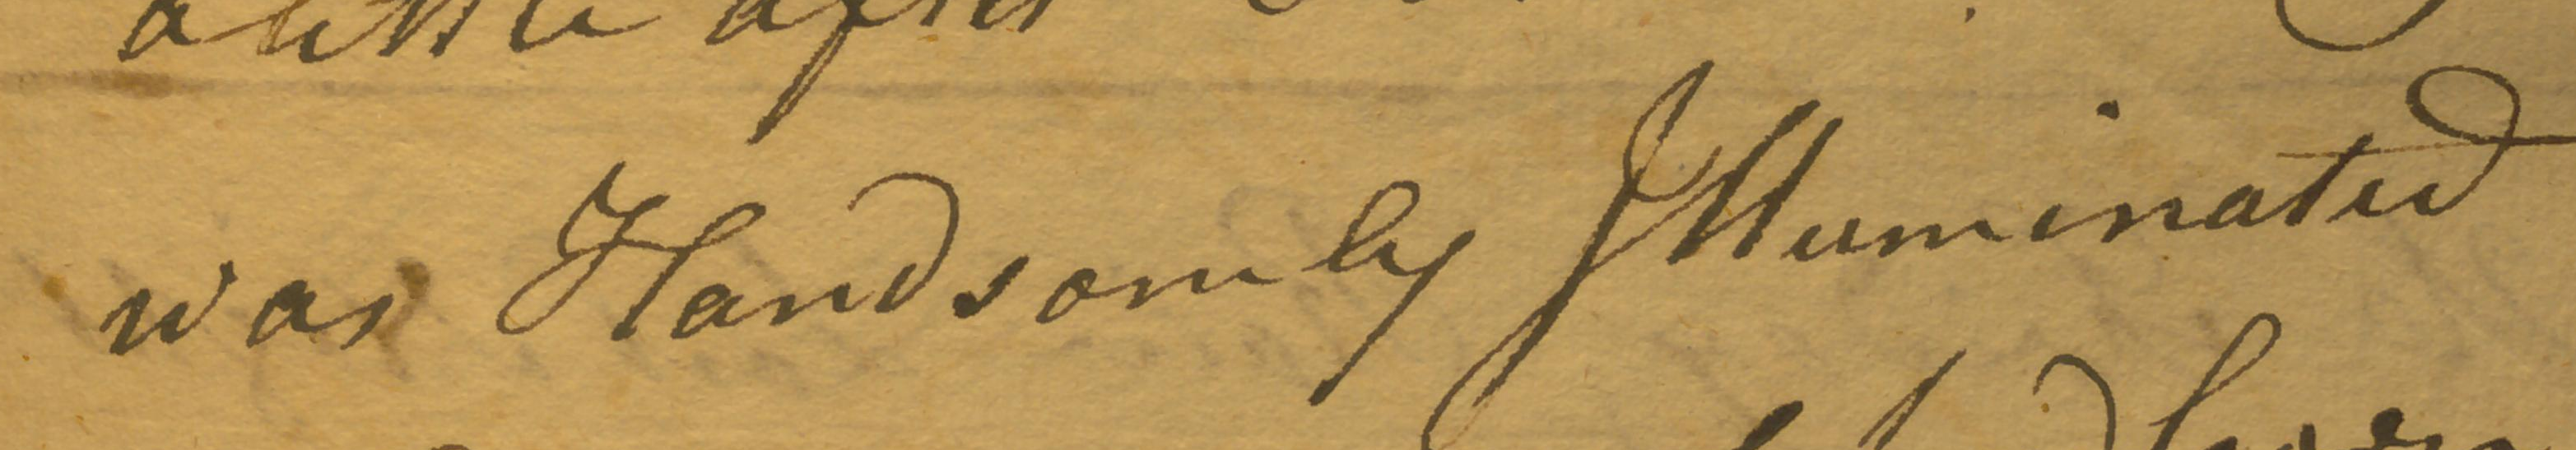was Handsomly Illuminated
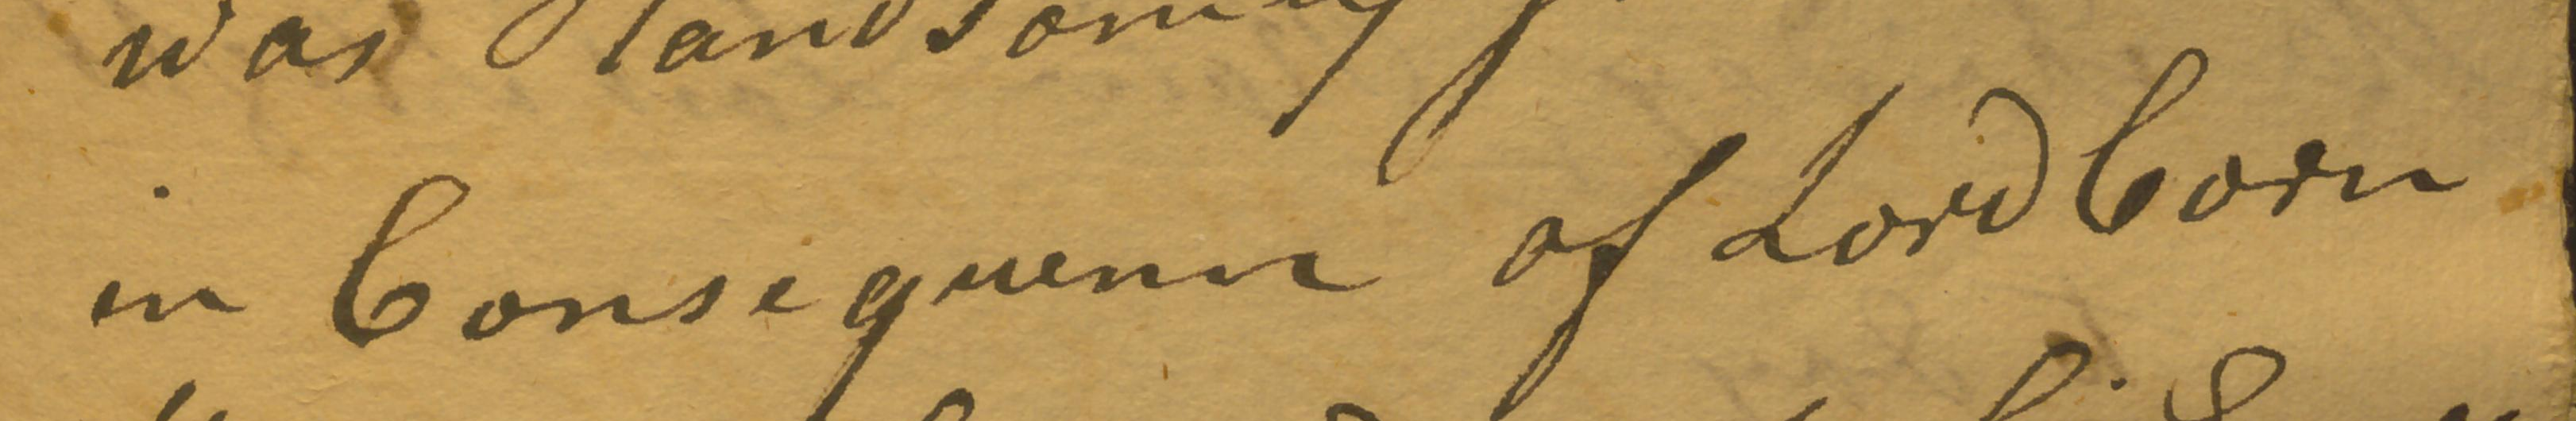in Consequence of Lord Corn
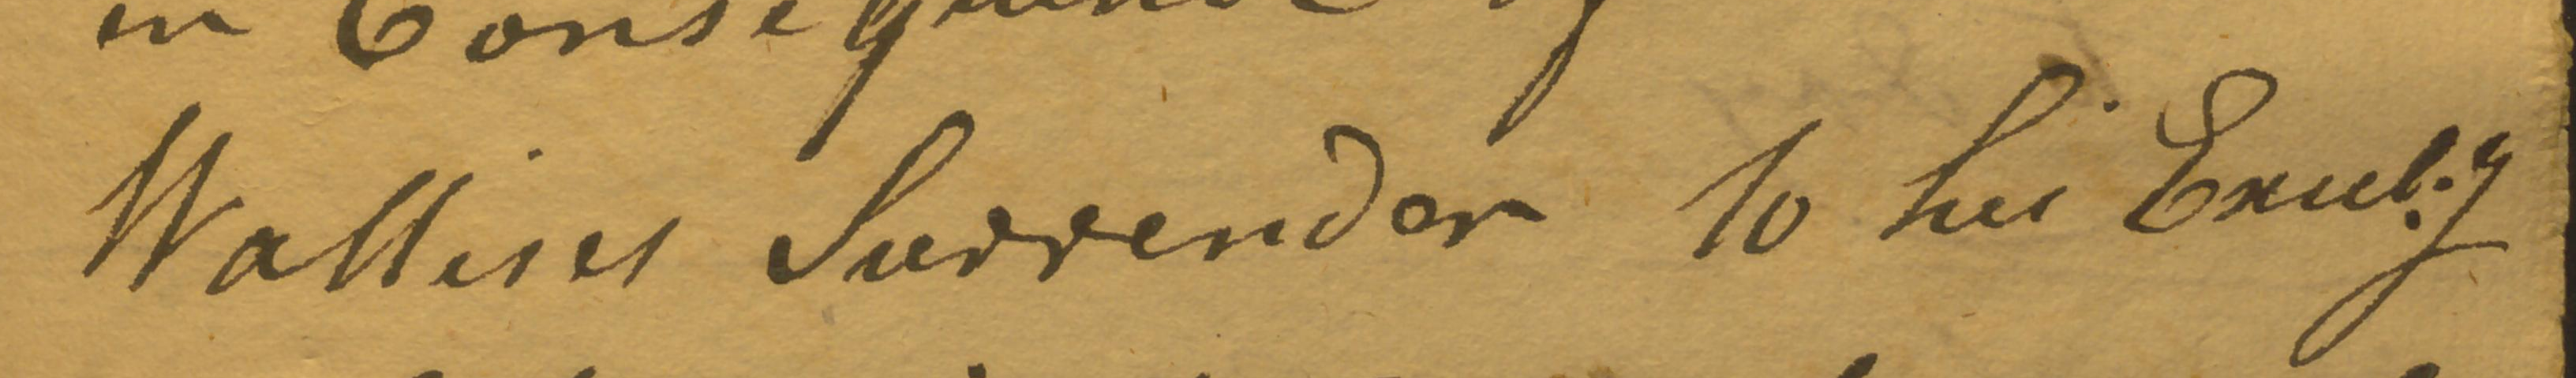Wallises surrender to his Excel^y:
